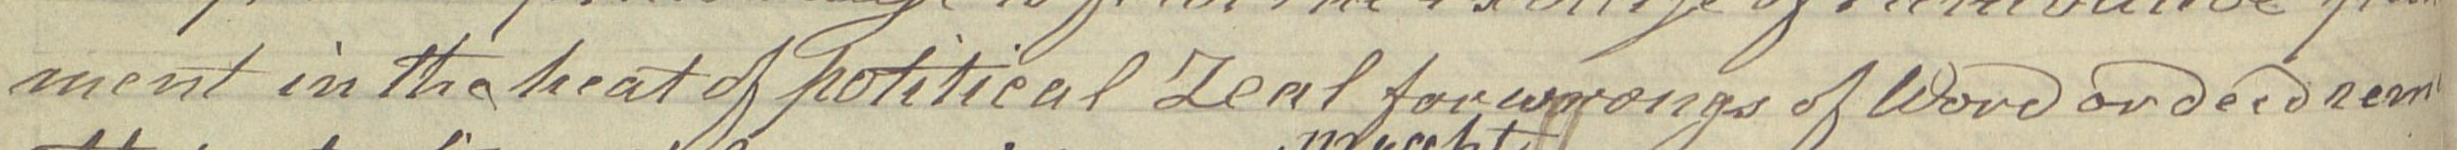ment in the heat of political Zeal for wrongs of Word orderd rem-
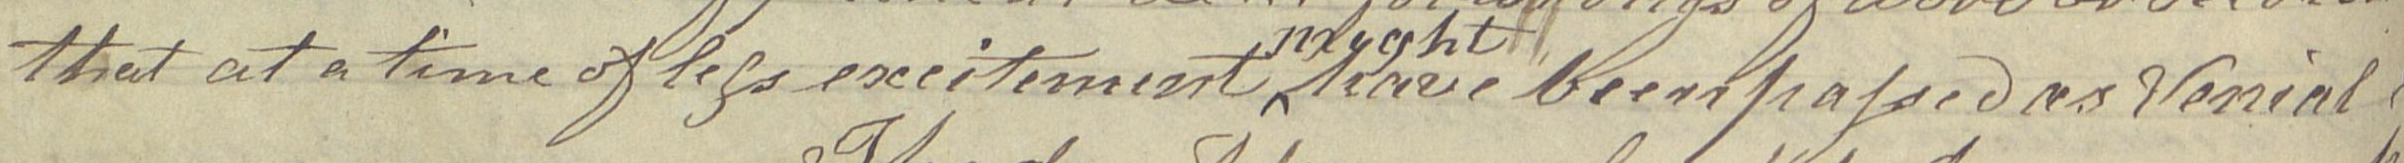that at a time of less excitement ^ have been passed as Venial
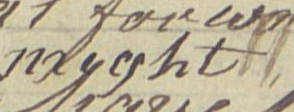might
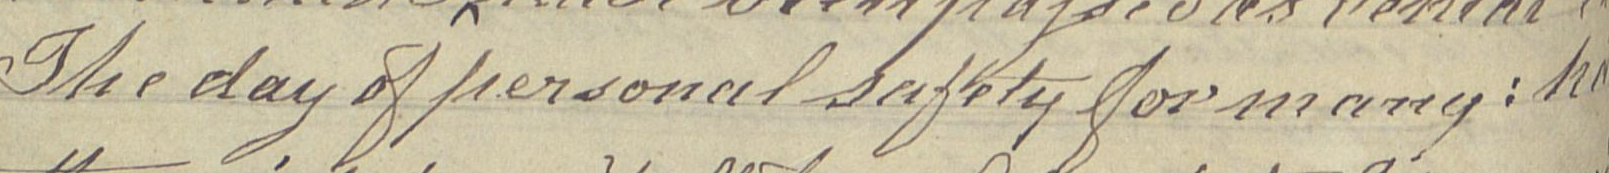The day of personal Safety for many: ha
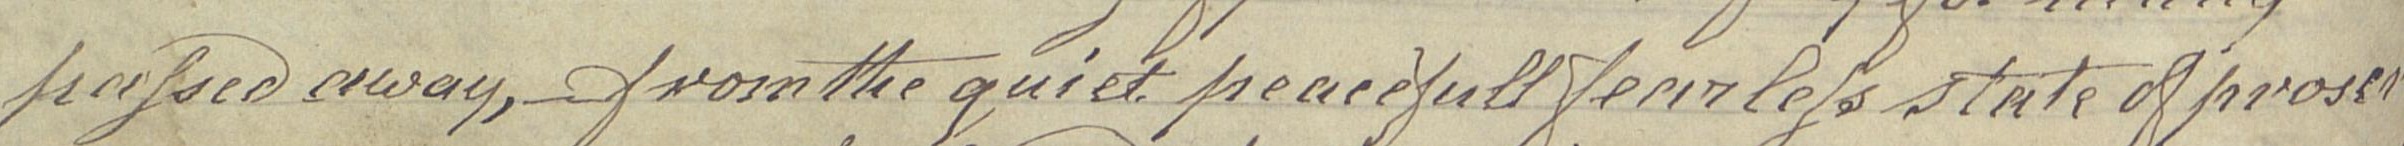passed away, from the quiet peaceful fearless state of prose
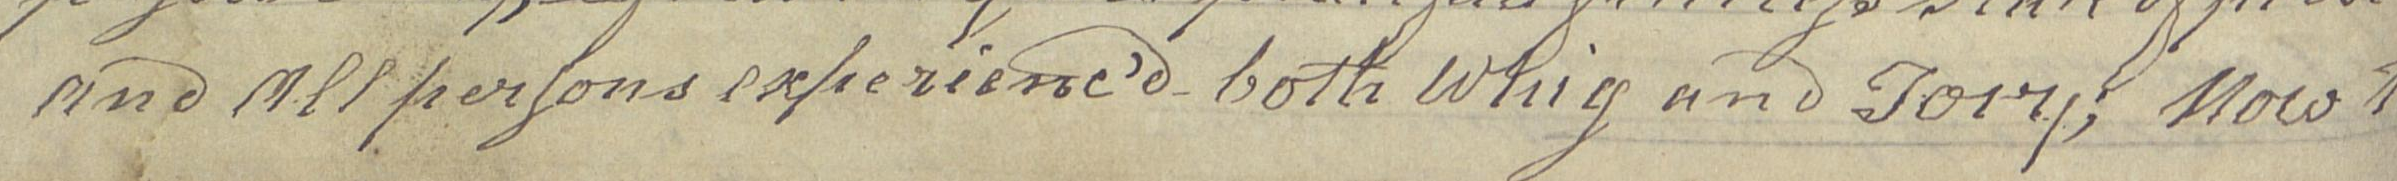and all persons experienc'd both whig and Tory, Now
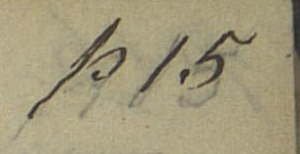p 15
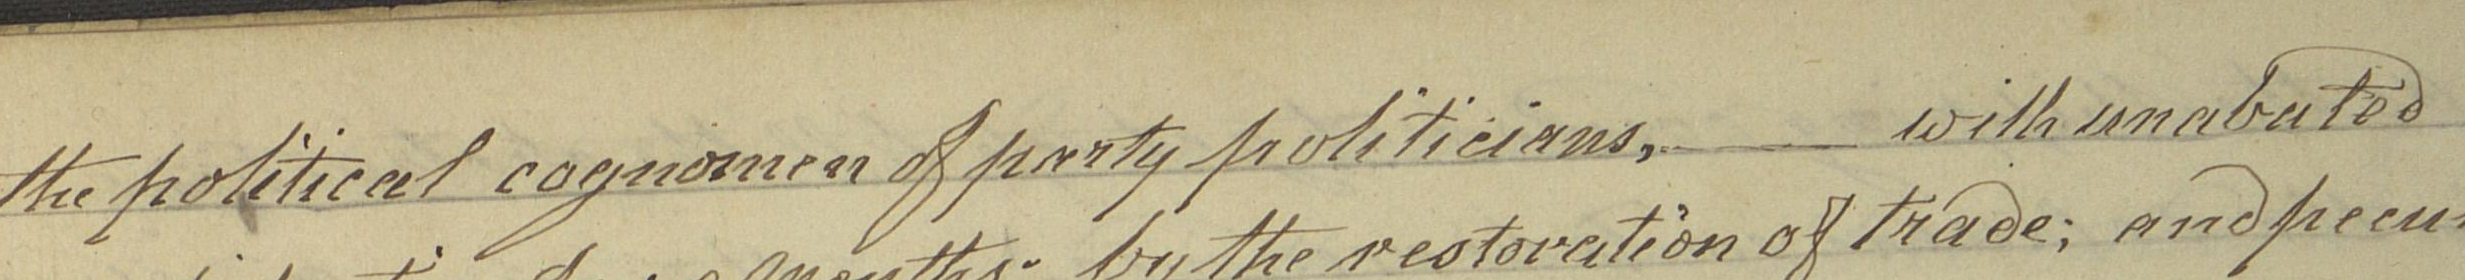the political cognoinen of party politicians, with unabated
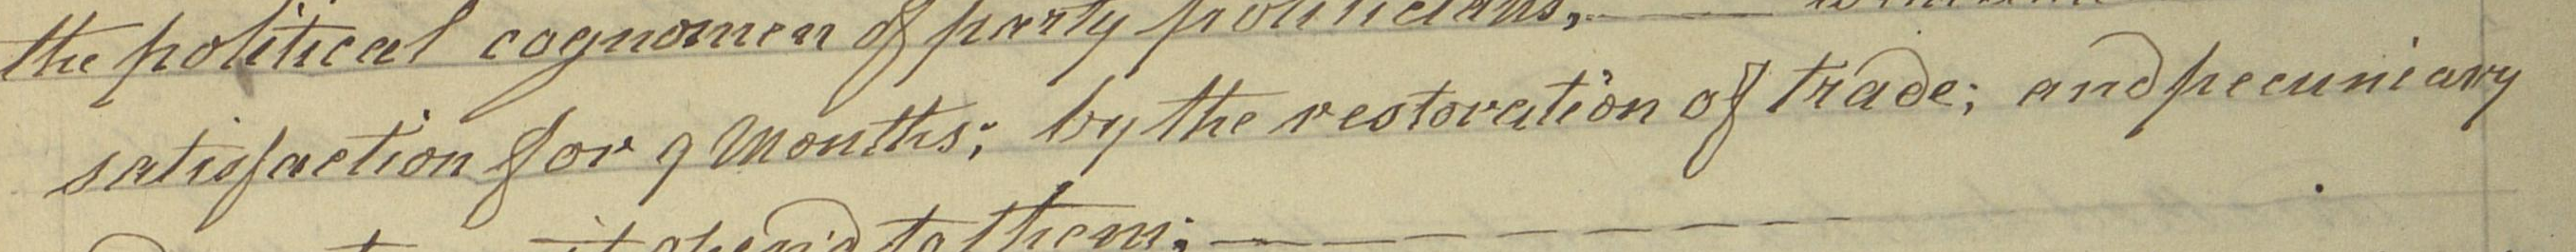satisfaction for 9 months; by the restoration of trade; and pecuniary
